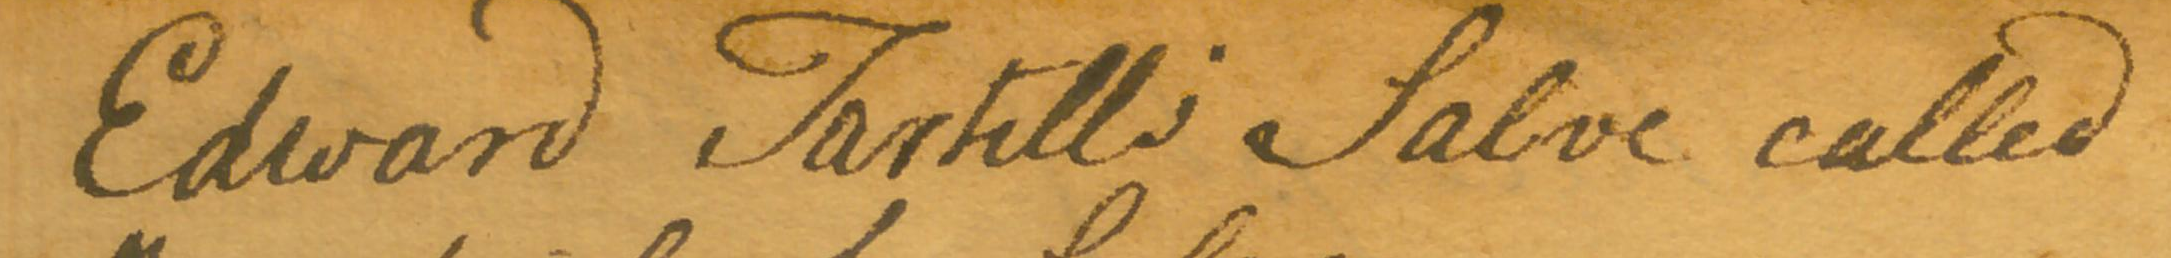Edward Tartill's Salve called
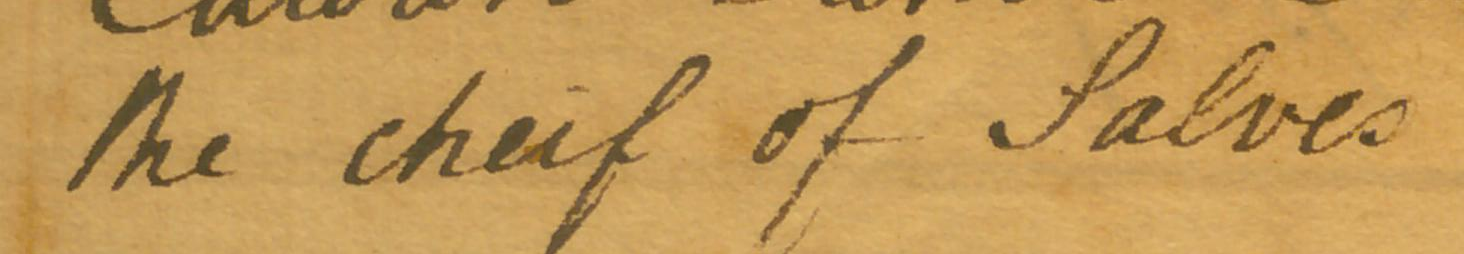the cheif of salves
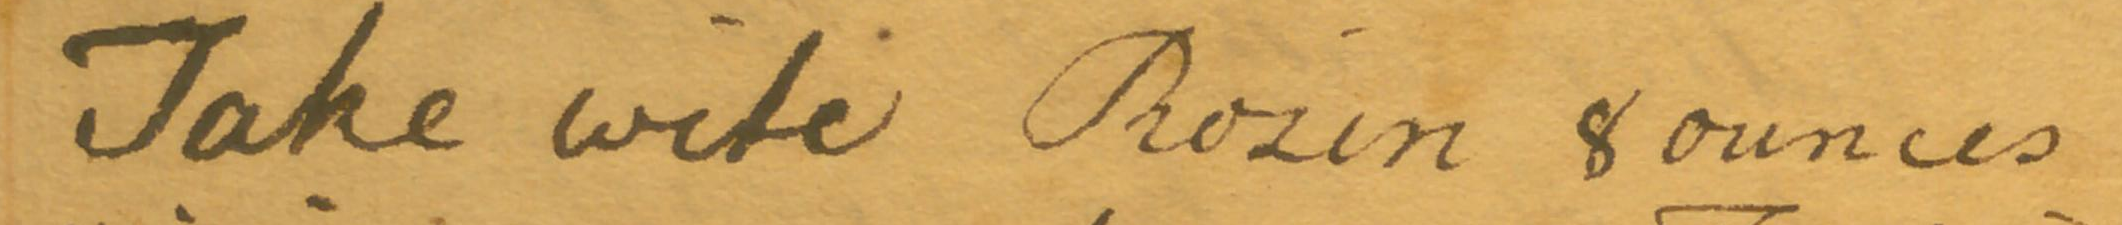Take wite Rozin 8 ounces
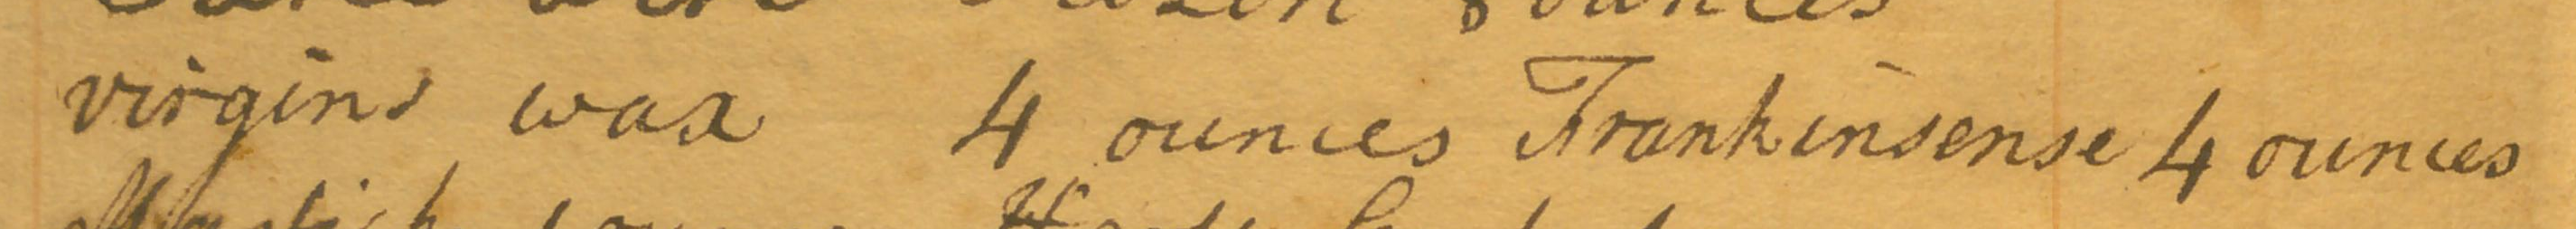virgins wax 4 ounces Frankinsense 4 ounces
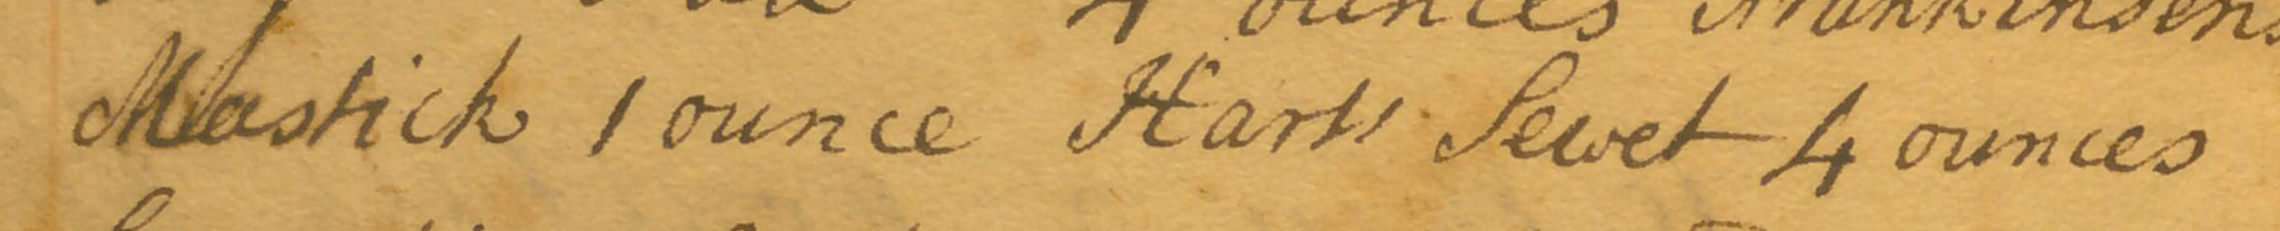Mastick 1 ounce Harts sewet 4 ounces
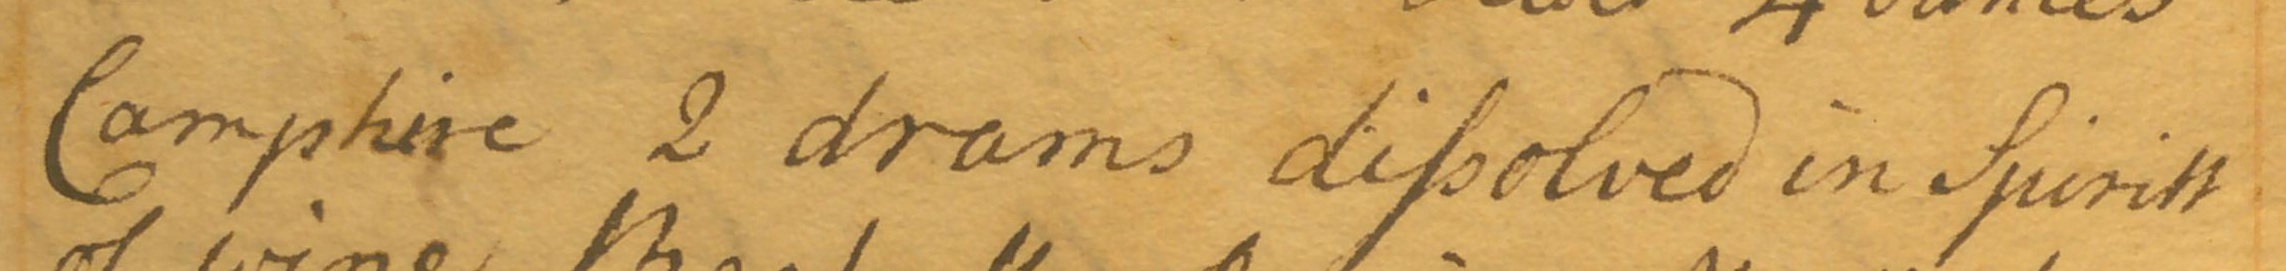Camphire 2 drams dissolved in Spiritt
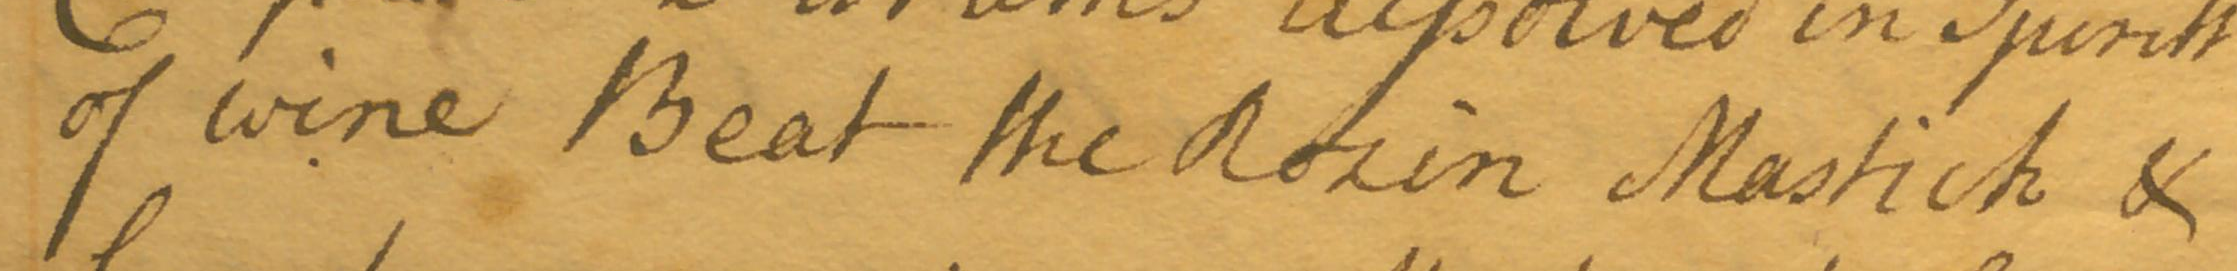of wine Beat the Rozin Mastik &
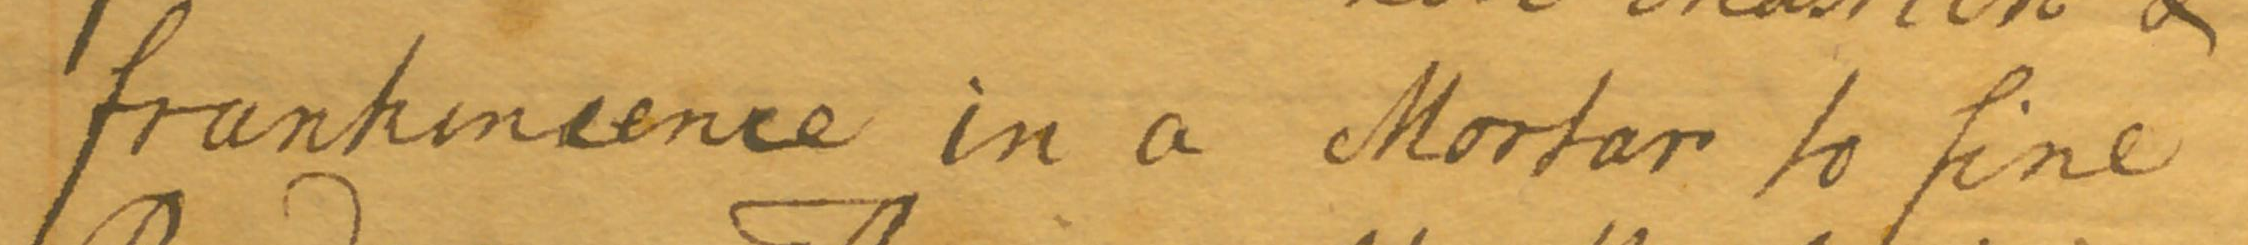frankincence in a Mortar to fine
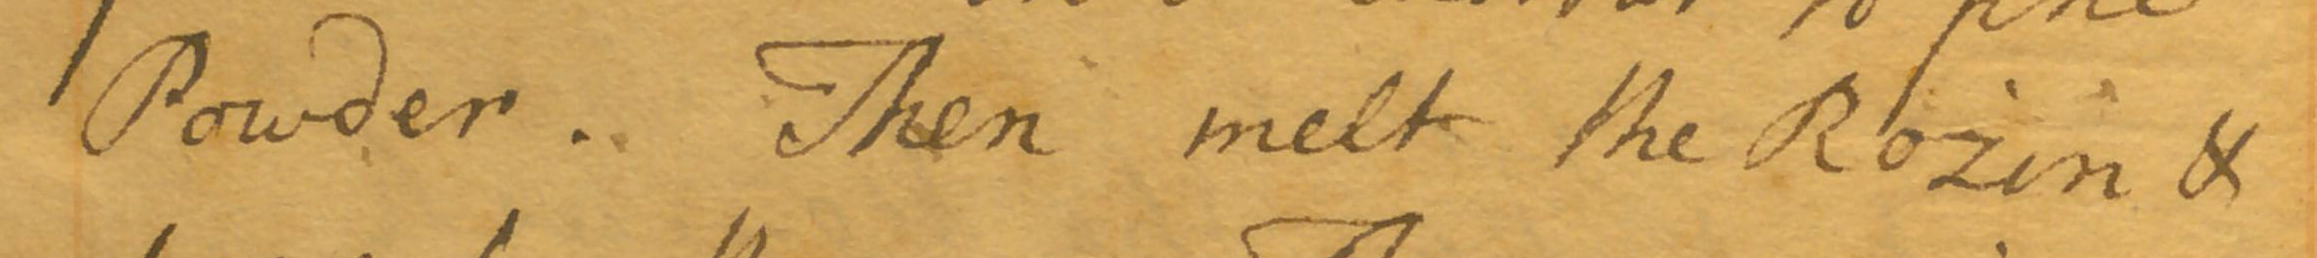Powder. Then melt the Rozin &
